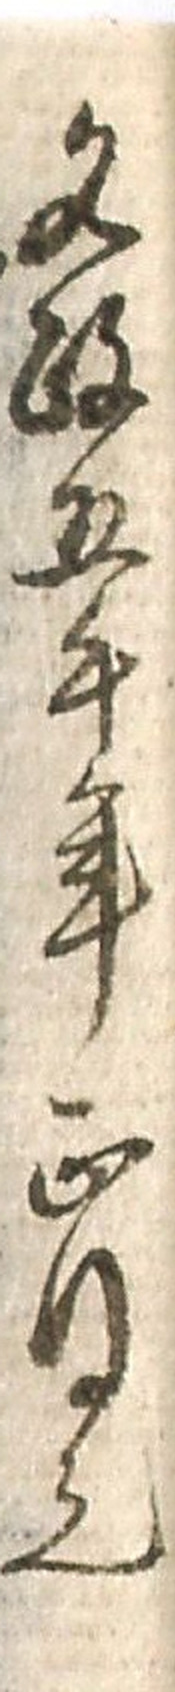文政五午年正月元
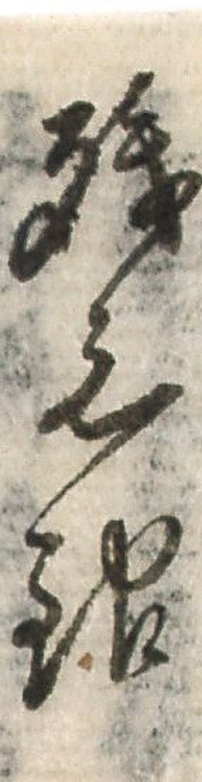残元銀
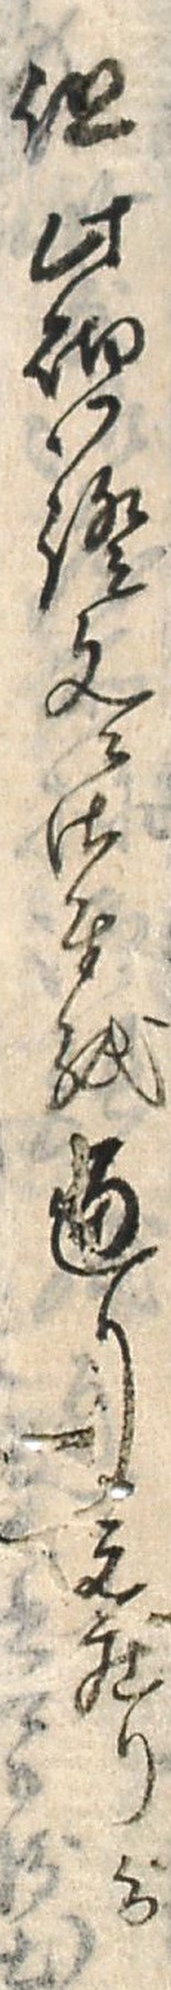但此砌御証文に御付紙通り元居り分
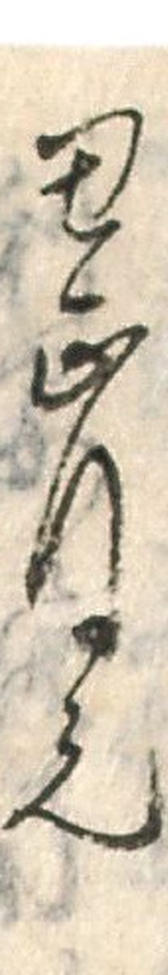丑正月元
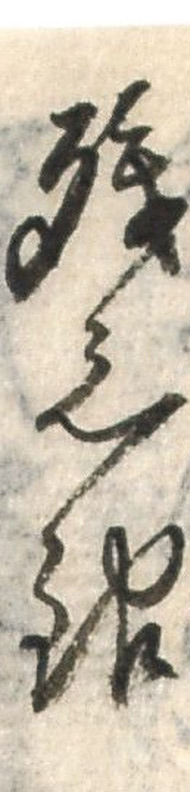残元銀
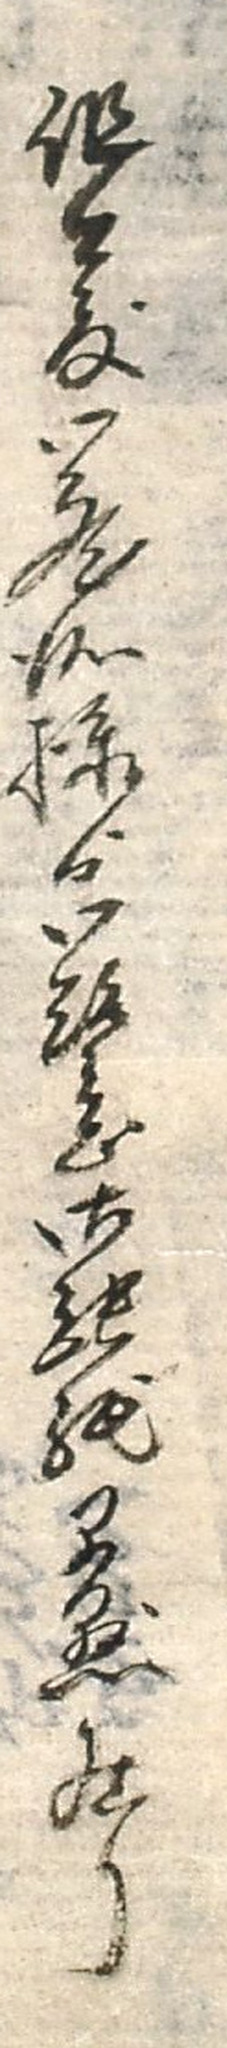但今度御蔵処様ゟ御趣意御張紙早懸居り
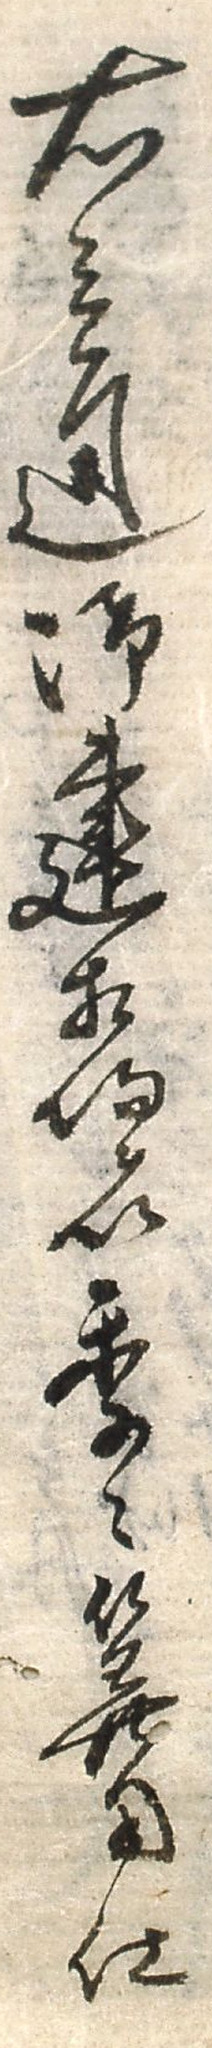右之通御建相場を以季々算用仕
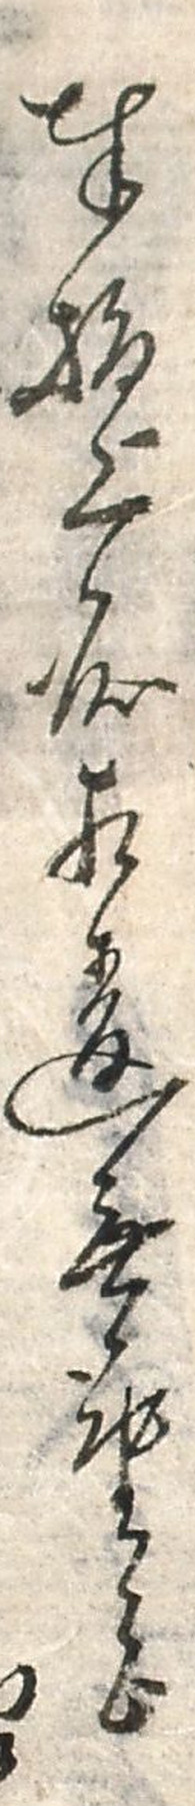奉指上候処相違無御座候以上
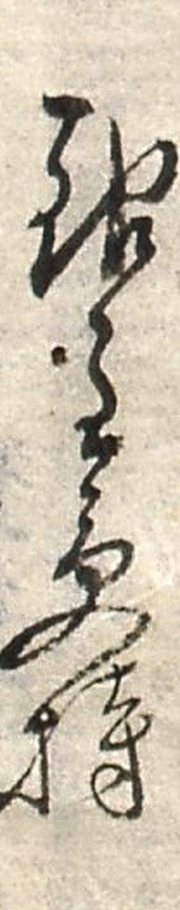銀主受持
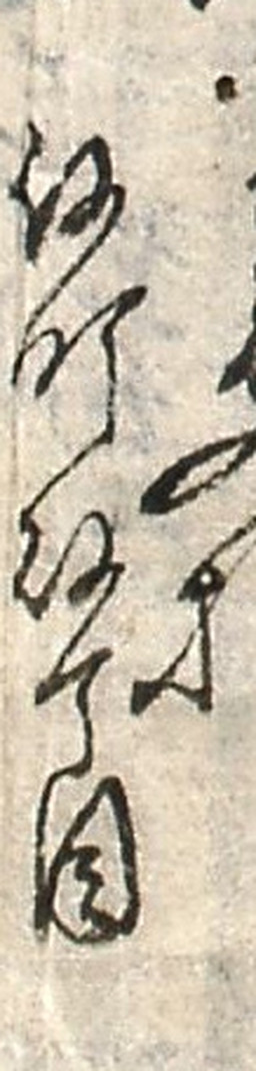何町何丁目
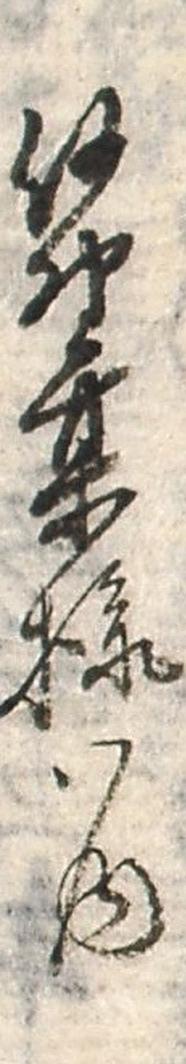何野某様御内
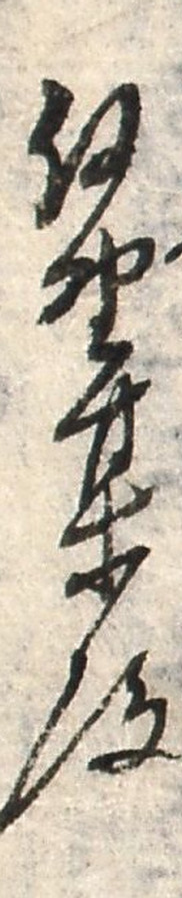何野某殿
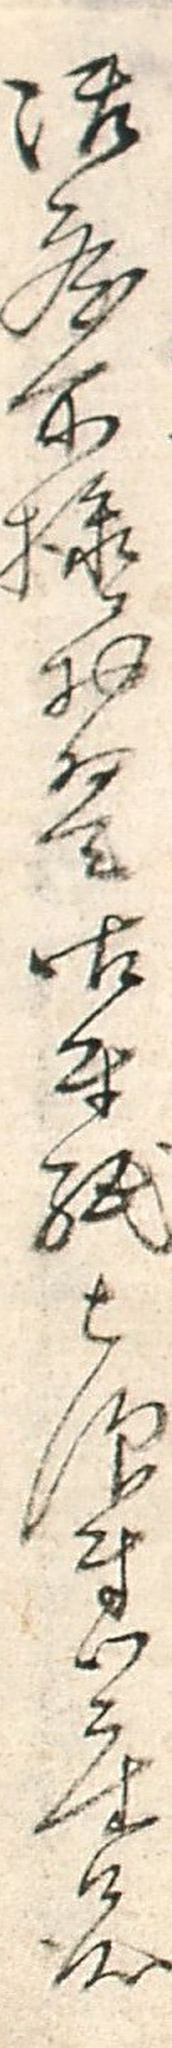御蔵所様におゐて御付紙被仰付御座候処
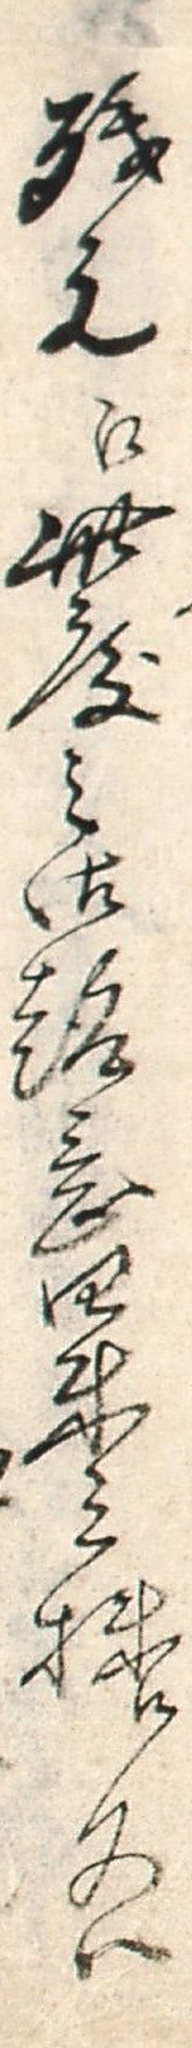残元え此度之御趣意四朱之株え又は
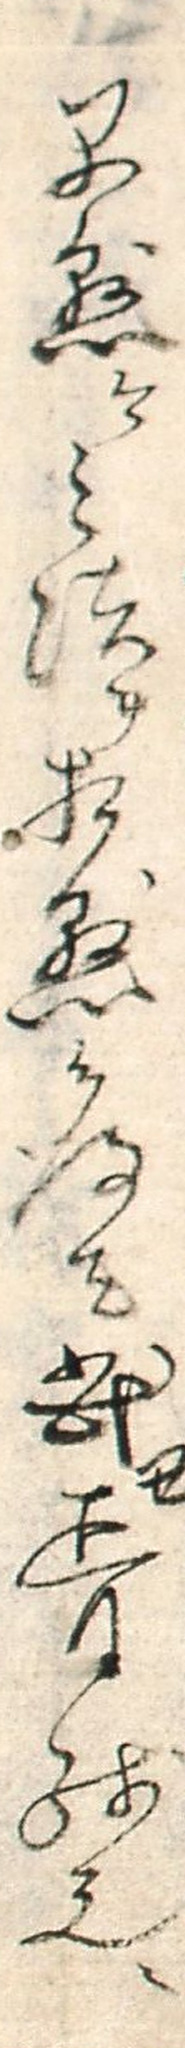早懸ケ之法を相懸候得は当丑正月残元に

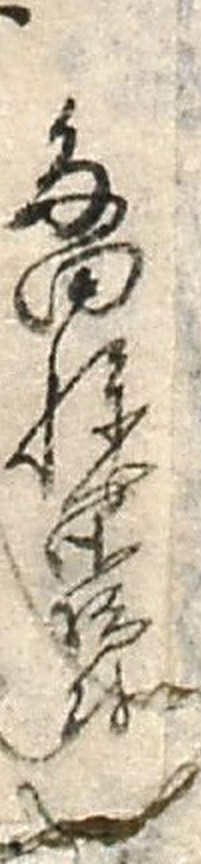多田様ゟ御指越
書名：御家中并無格御奉公人借銀御仕解一件御書付写其余共控
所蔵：鳴門教育大学 Naruto University of Education
